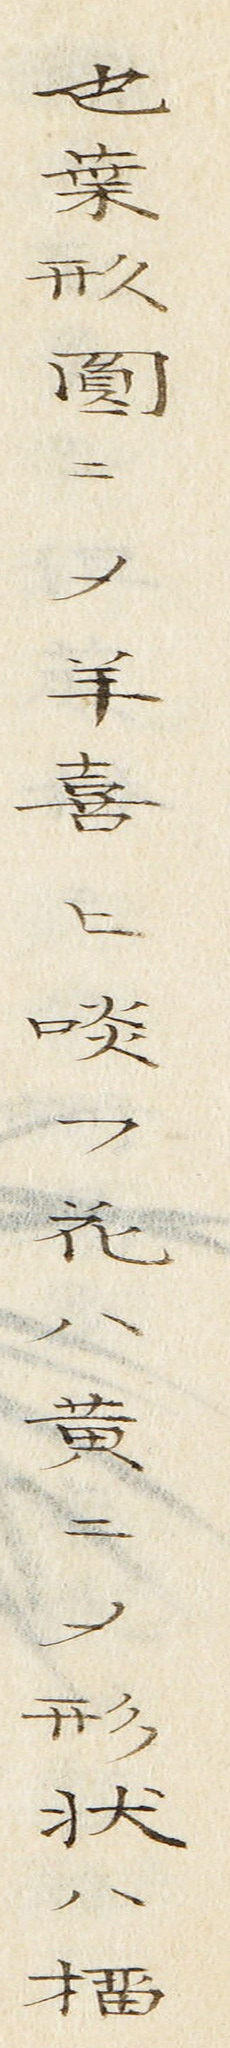也葉形円ニシテ羊喜ヒ啖フ花ハ黄ニシテ形状ハ橊
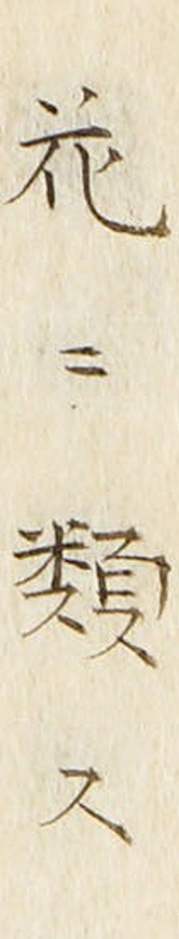花ニ類ス
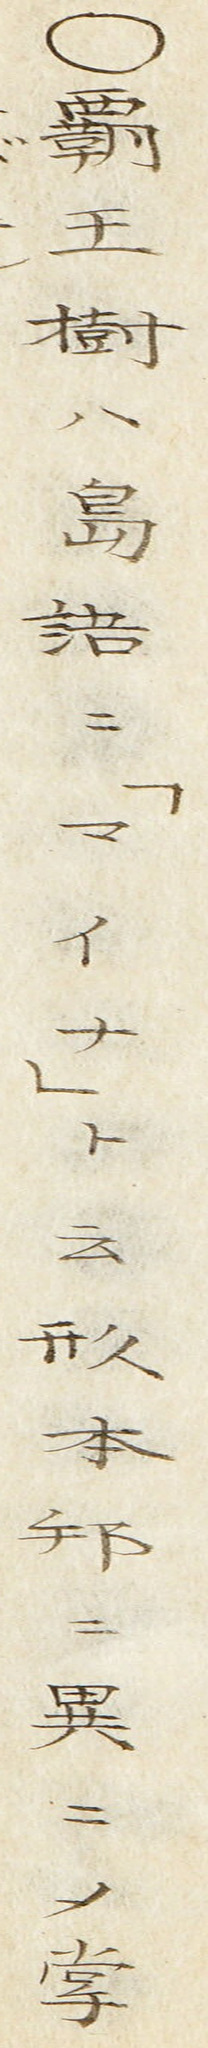〇覇王樹ハ島語ニ「マイナ」ト云形本邦ニ異ニシテ掌
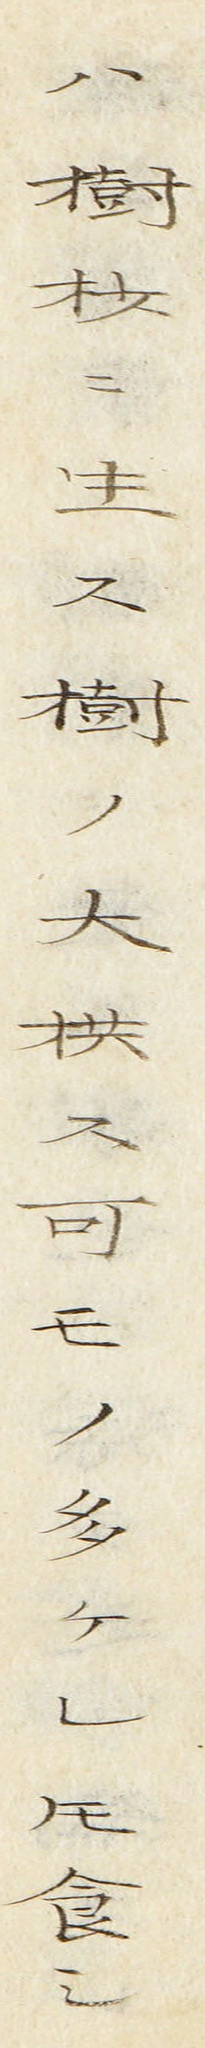ハ樹抄ニ生ス樹ノ大栱ス可モノ多ケレトモ食シ

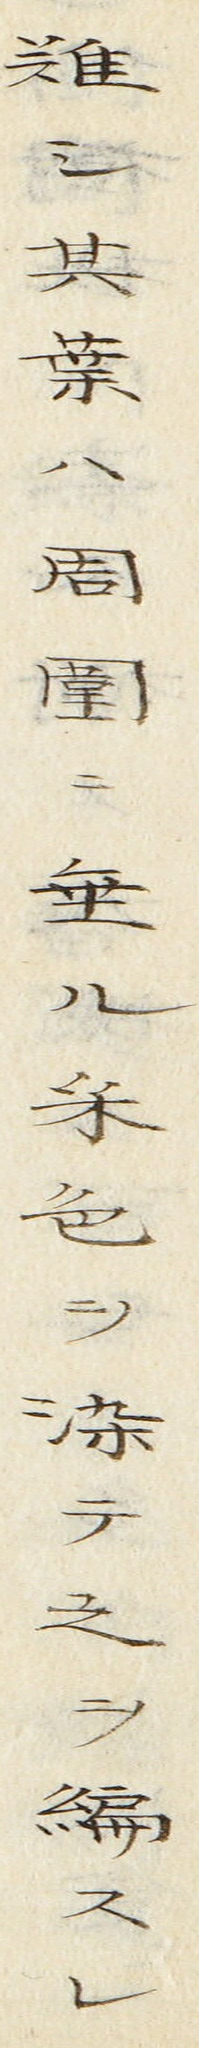難シ其葉ハ周囲ニ垂ル采色ヲ染テ之ヲ編スレ
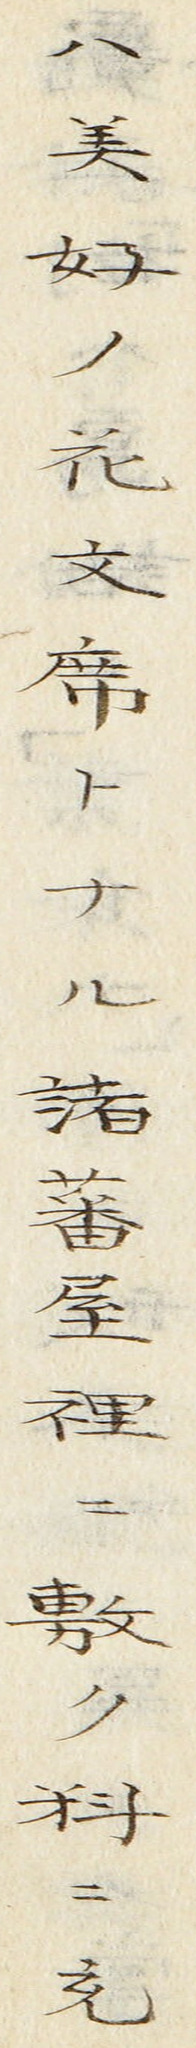ハ美好ノ花文席トナル諸蕃屋裡ニ敷ク料ニ充
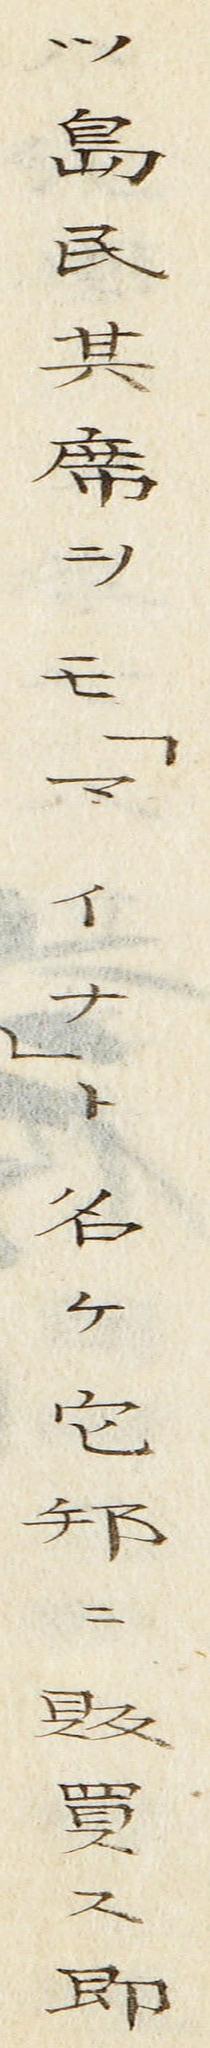ツ島民其席ヲモ「マイナ」ト名ケ它邦ニ販売ス即
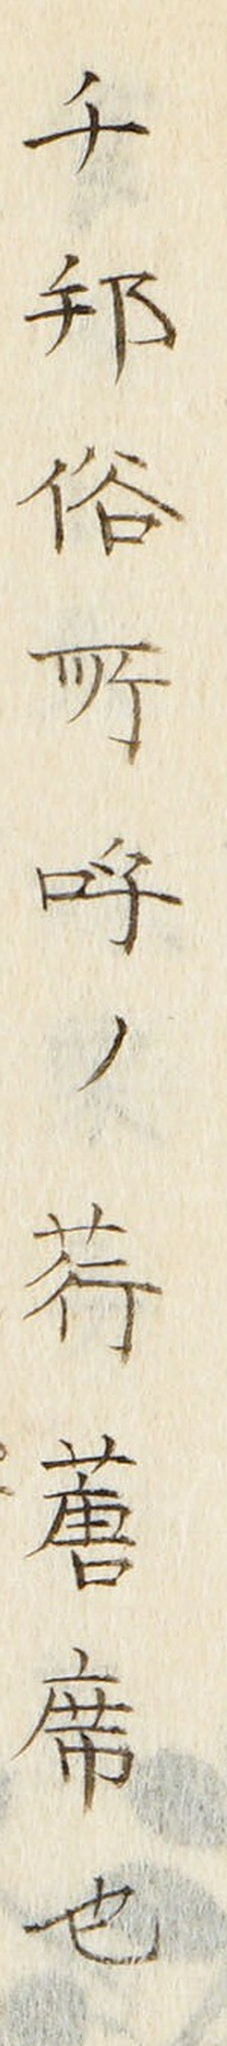チ邦俗所呼ノ荇蓎席也
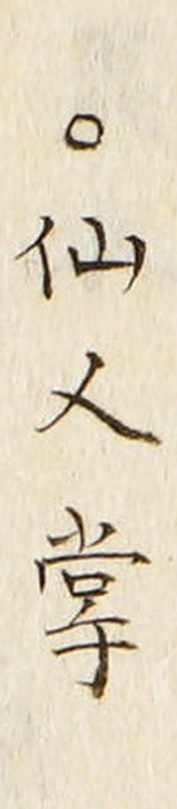〇仙人掌
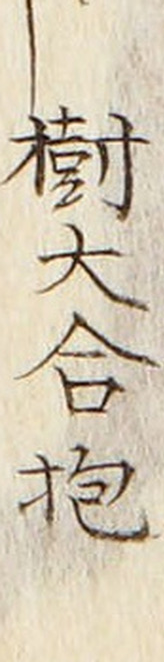樹大合抱
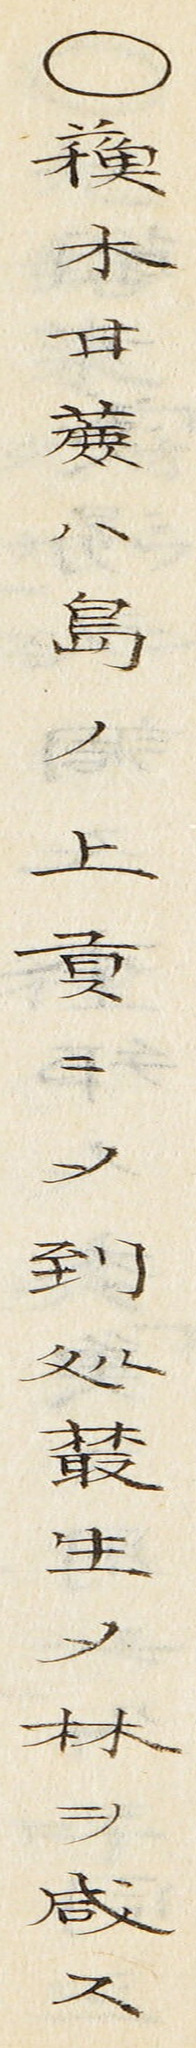〇蘓木甘蔗ハ島ノ上貢ニシテ到処樷生シテ林ヲ咸ス
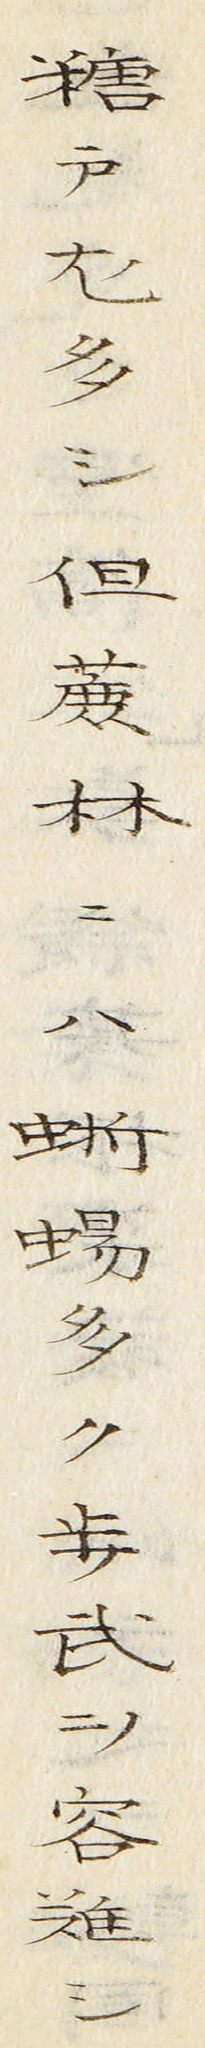糖戸尤多シ但庶林ニハ蜥蜴多ク歩武ヲ容難シ
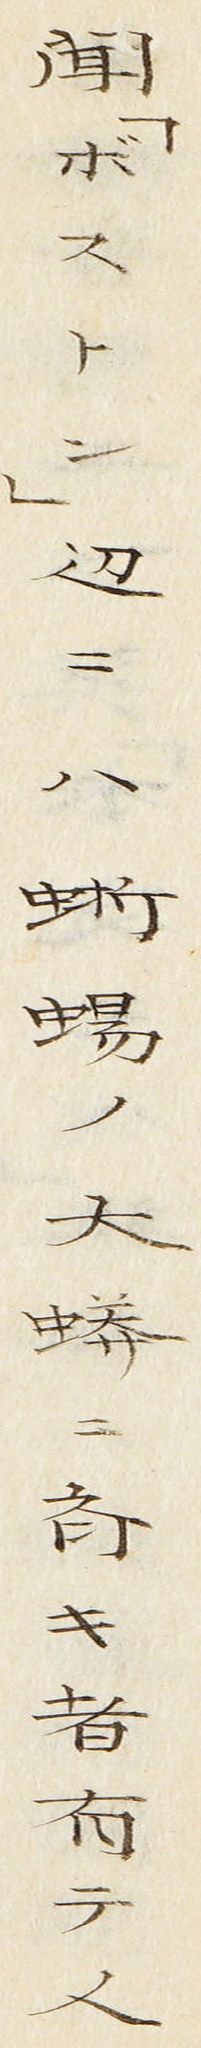聞「ボストン」辺ニハ蜥蜴ノ大蟒ニ斉キ者有テ人
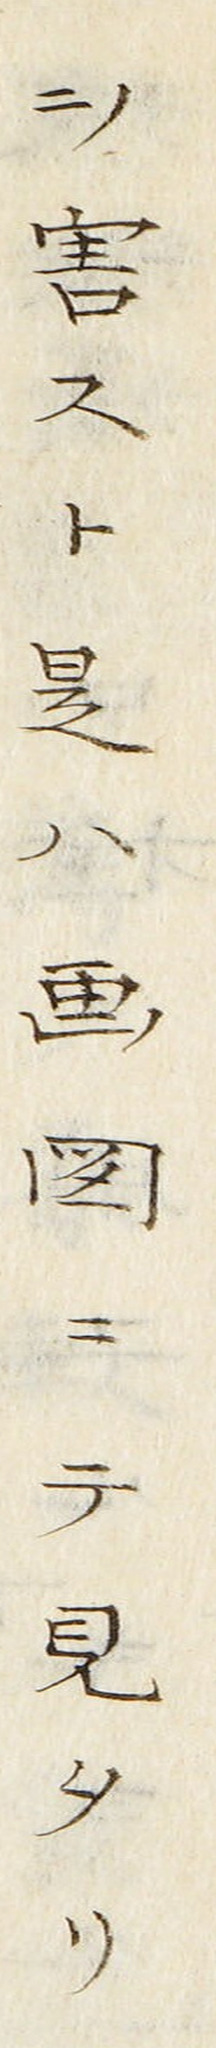ヲ害スト是ハ画図ニテ見タリ
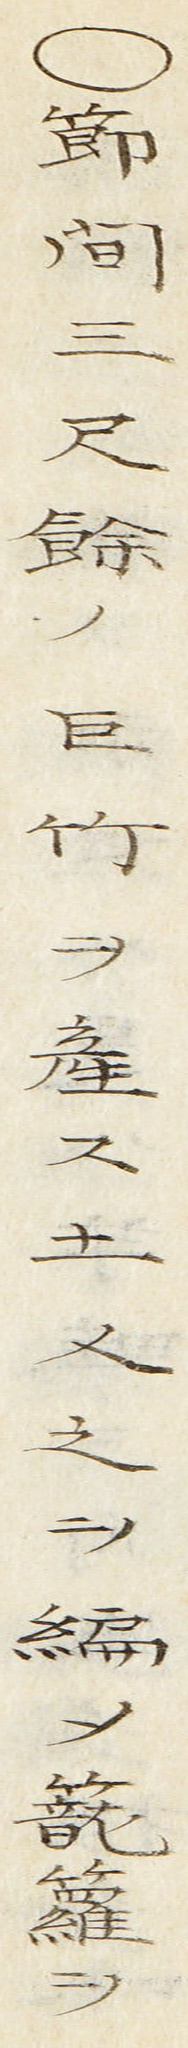〇節間三尺余ノ巨竹ヲ産ス土人之ヲ編シテ籠籮ヲ
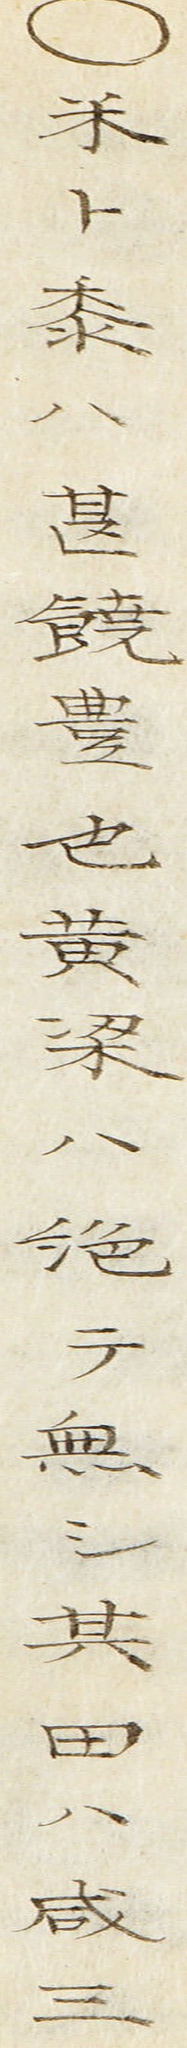〇米ト黍ハ甚饒豊也黄粱ハ絶テ無シ其田ハ咸三
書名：蕃談
